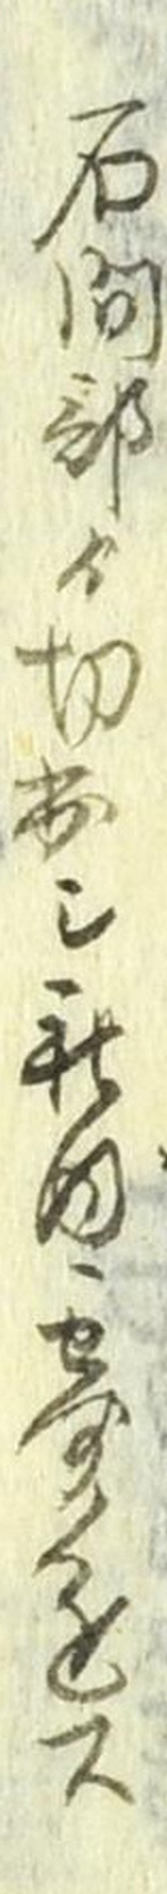石間部ゟ切出シ社内へ寄進ス
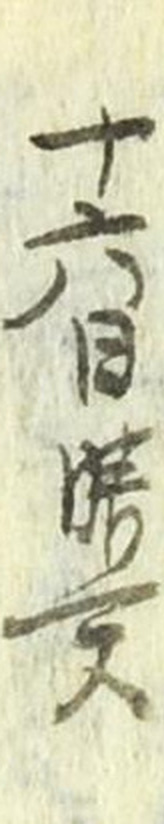十六日晴天
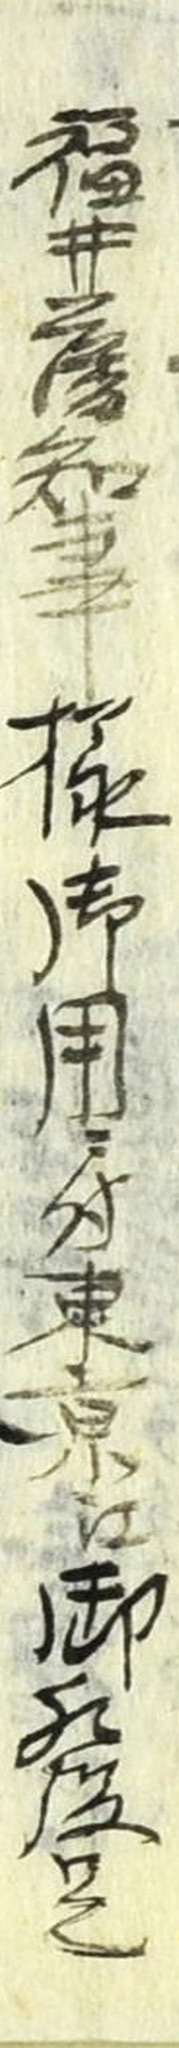福井藩知事様御用ニ付東京江御発足
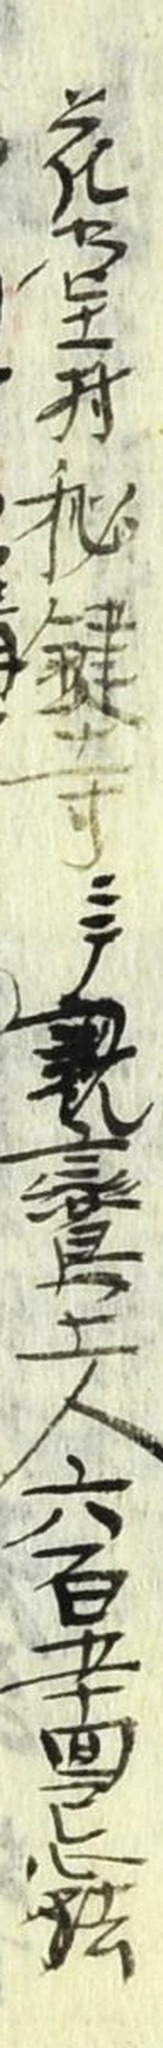花堂村秘鍵寺ニテ親鸞上人六百五十回忌法
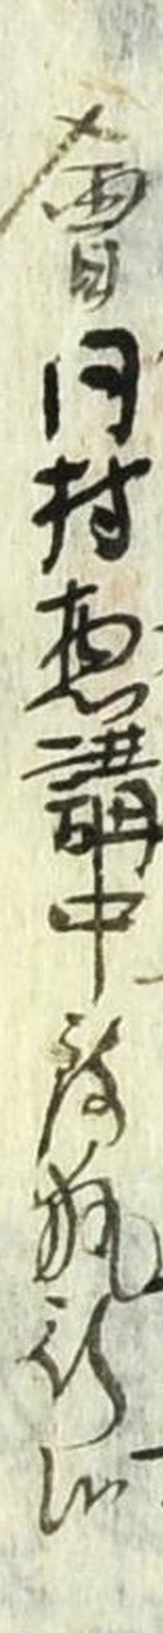会同村惣講中致執行候
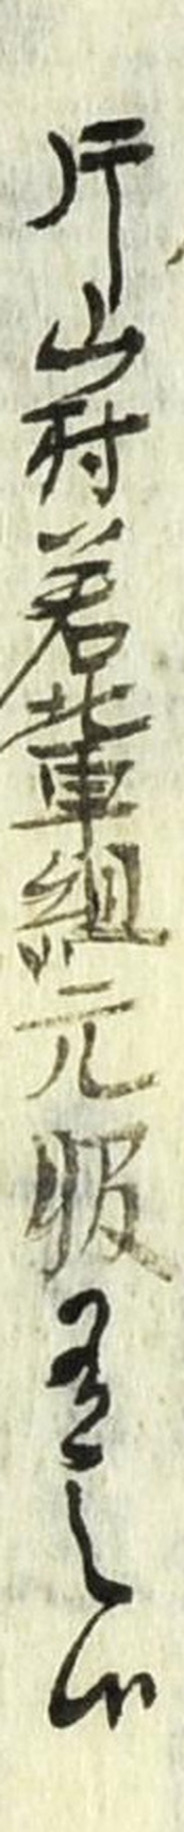片山村若輩組元服有之候
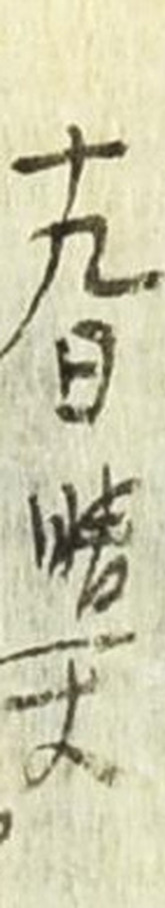十六日晴天
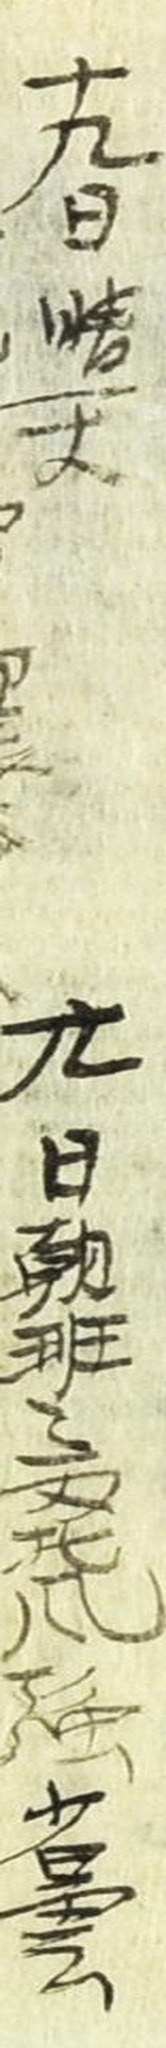十九日晴天廿日朝班々雨北風強少曇
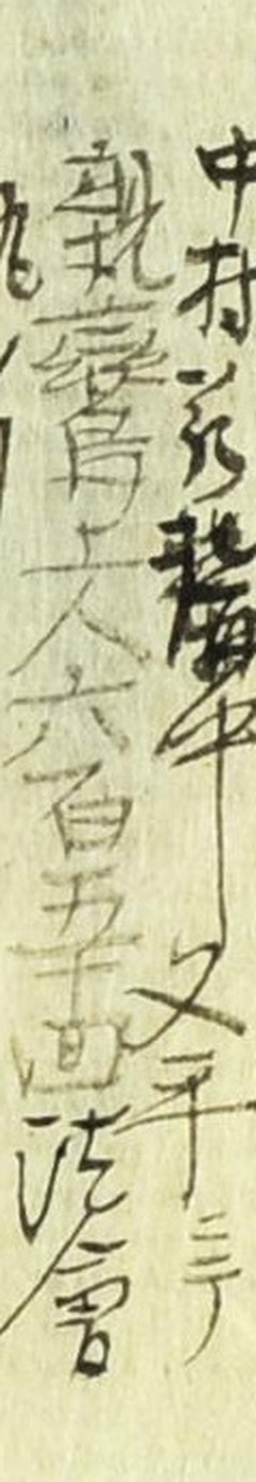親鸞上人六百五十回忌法会
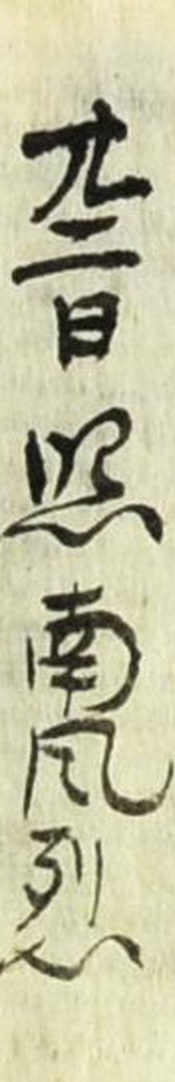廿二日照南風烈
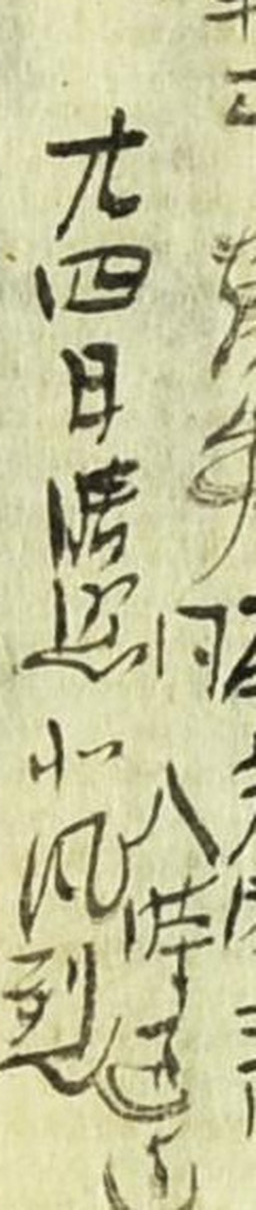廿二日照南風烈
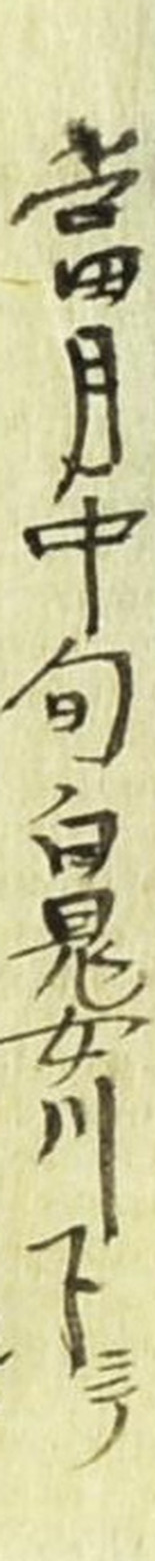当月中旬白鬼女川下ニテ
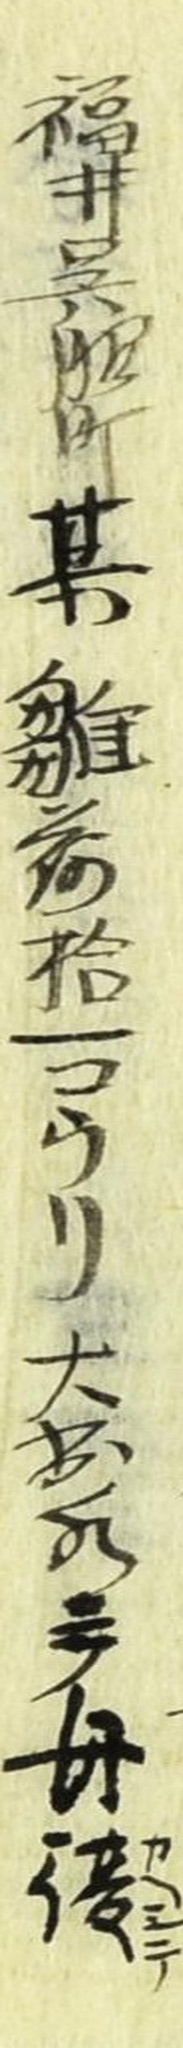福井呉服町某雛荷拾一コウリ大出水ニテ舟復
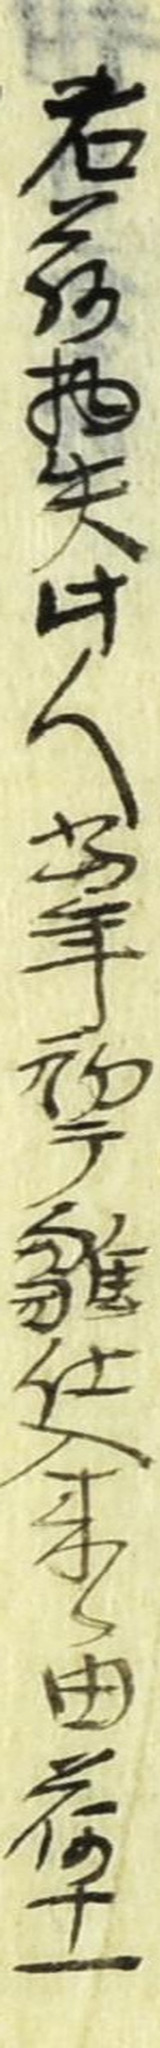右荷物失此人当年初テ雛仕入来候由荷十一
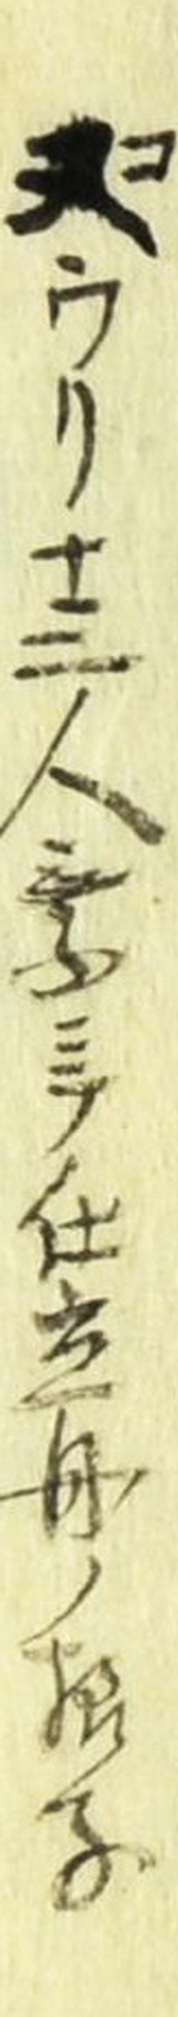又ウリ十三人乗ニテ仕立舟ノ様子
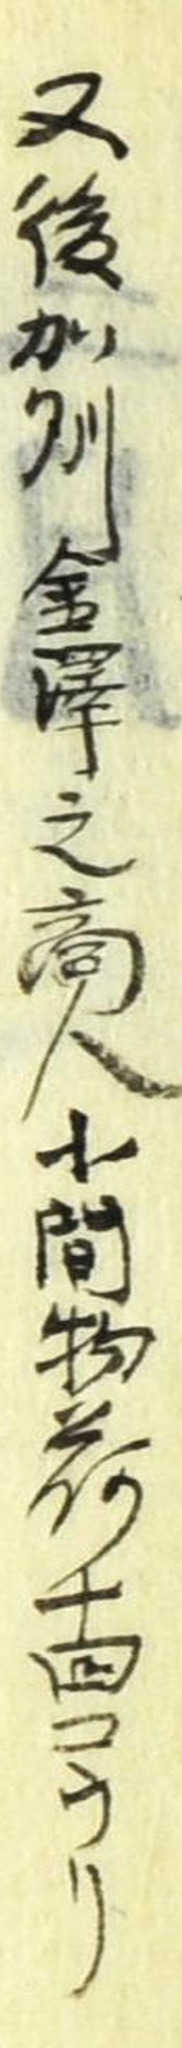又後加州金沢之商人小間物荷十四コウリ
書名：（日記）
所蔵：福井県文書館 Fukui Prefectural Archives
